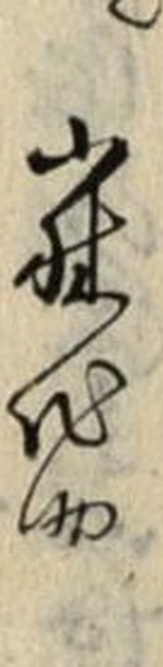小林作助
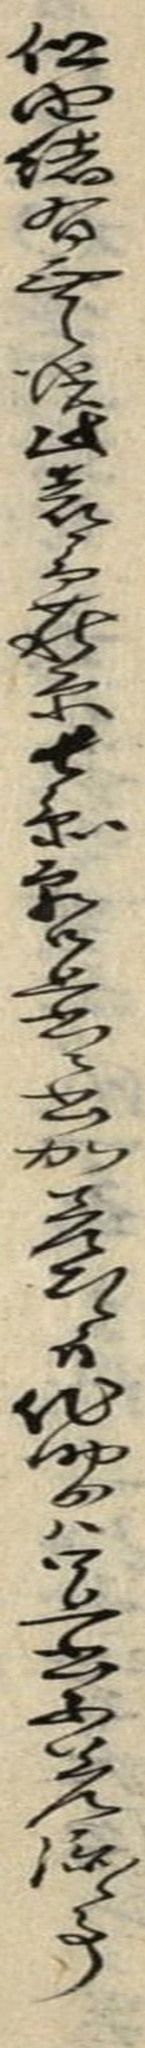但由緒有無之儀ハ此表ニ而萩原長兵衛願口上書ニ書加差出候ニ付作助ゟハ口上書不差添候事
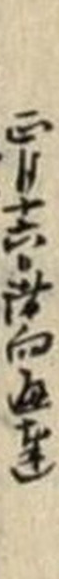正月十六日諸向通達
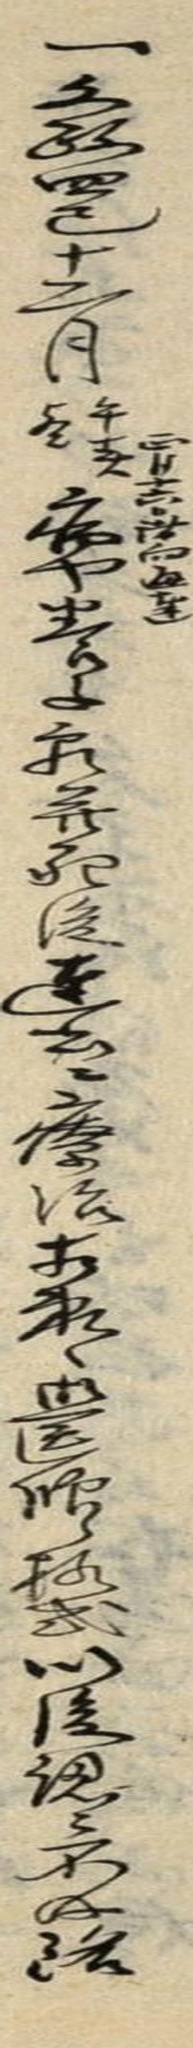一文政四巳十二月午春歟病中養子願并死後達書ニ療治相頼候御医師格式之格式以後認ニ不及銘
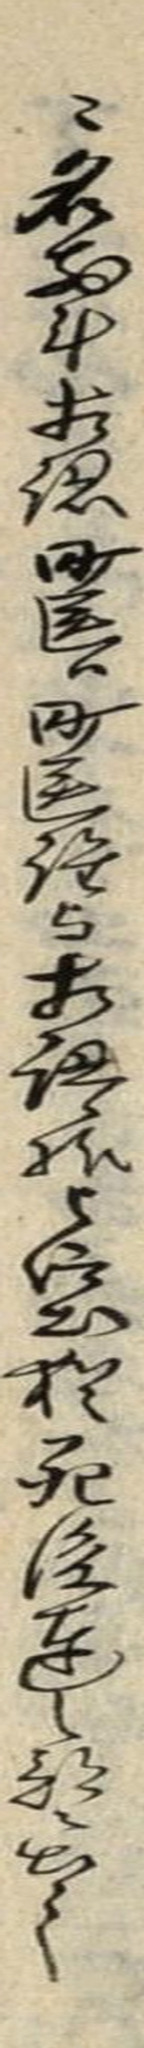々名前斗相認町医ハ町医誰与相認候様被仰出猶死後達之部ニ出之
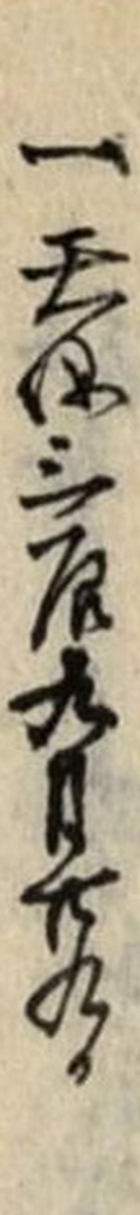一天保三辰九月廿九日
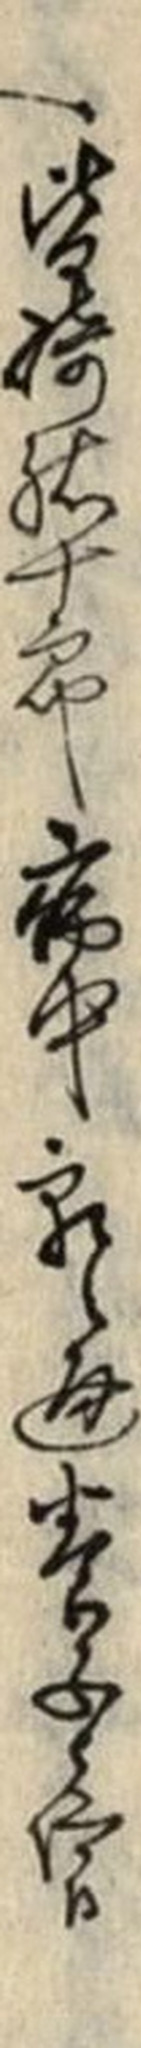皆崎祐十郎病中願之通養子被仰付
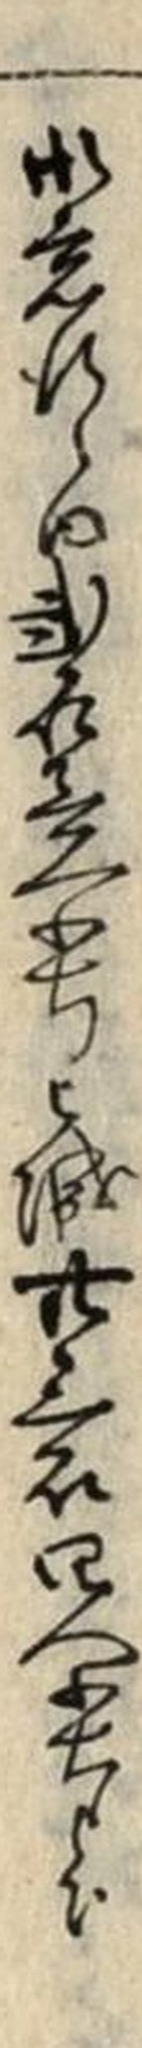御宛行之内弐石壱人ふち被減廿三石四人ふち被下
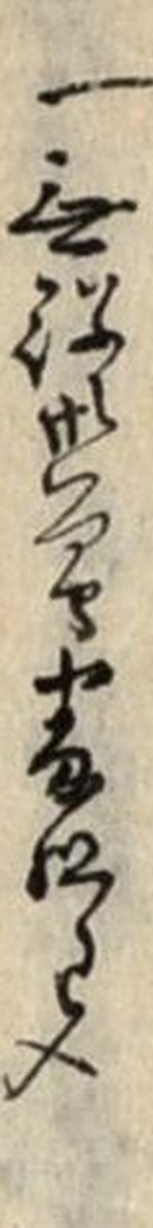無役御留守番組入ニ被入
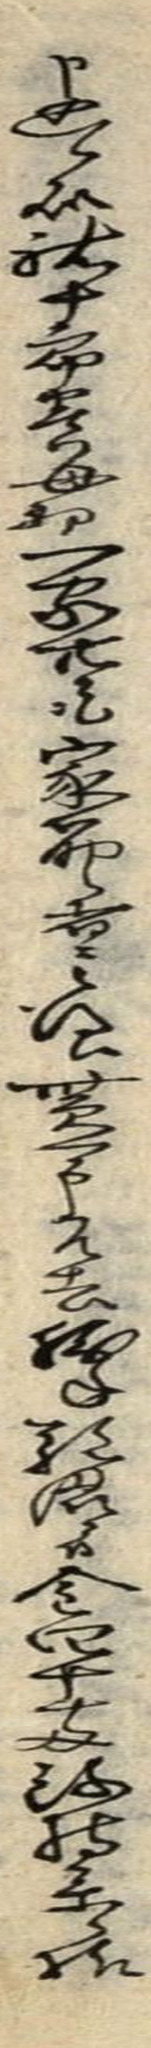申上候処祐十郎養母初一家共ニも家筋之者ニ候得ハ貰可申乍去例年難渋ニ付金四十両致持参候様
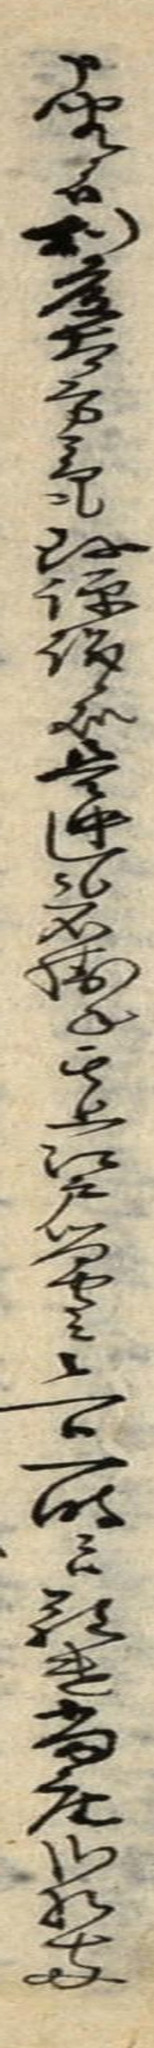申聞候ニ付利藤太方ニ而も致評議候処是迚も不勝手其上江戸留守ニ候へハ一時ニハ難遣当座弐拾両
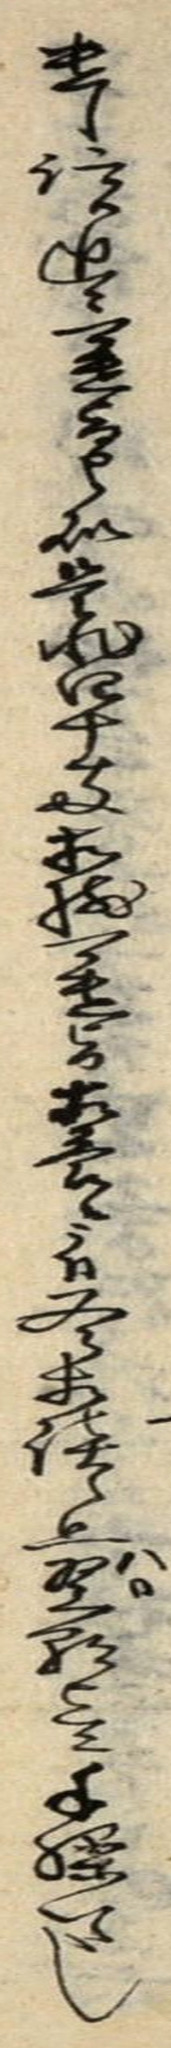遣候跡ハ追々可遣申候処是非四十両相揃可遣旨相答候ニ付又々相談之上翌朝八日迄ニ手繰いたし

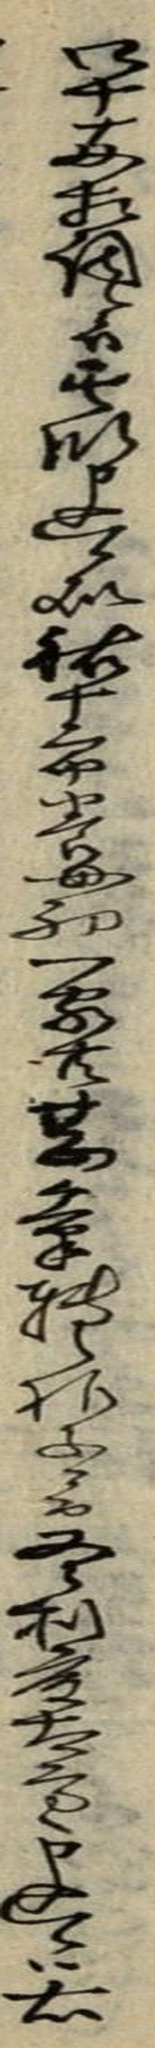四十両相調候ニ付其段申込候処祐十郎養母初一家共甚幸転之様子ニ而又々利藤太方ヘ申込候ハ右
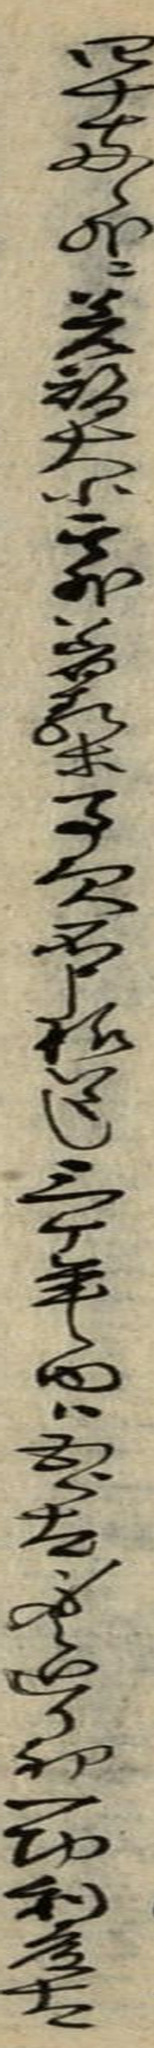四十両之外ニ差替大小其外着類等事欠不申様いたし三ケ年之内ハ五郎太身之廻り初一切利藤太
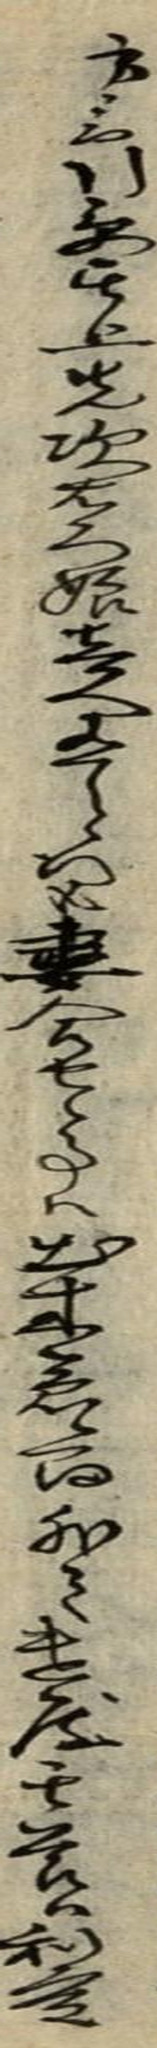方ニ而引受其上先次右衛門娘壱人有之候得共妻合セ候事ハ出来兼候間外々ヘ遣度其節ハ利藤
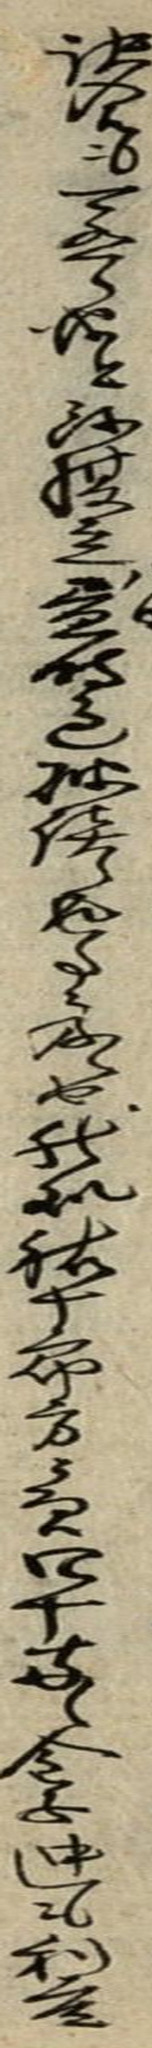訳合も可有之儀と致腹立八日昼時過破談之返事ニ及候也然共祐十郎方ニ而ハ四十両之金子迚も利藤
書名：養子縁組之部
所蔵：福井県文書館 Fukui Prefectural Archives
